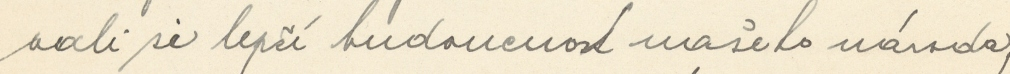vali si lepší budoucnost našeho národa,
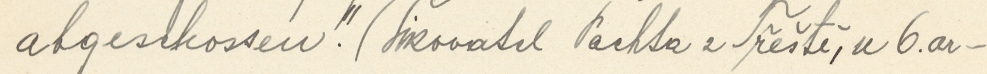abgesshosten“. (Šikovatel Pachta z Třeště, u 6. ar-
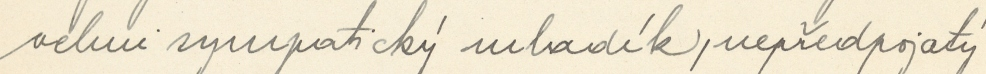velmi sympatický mladík, nepředpojatý
